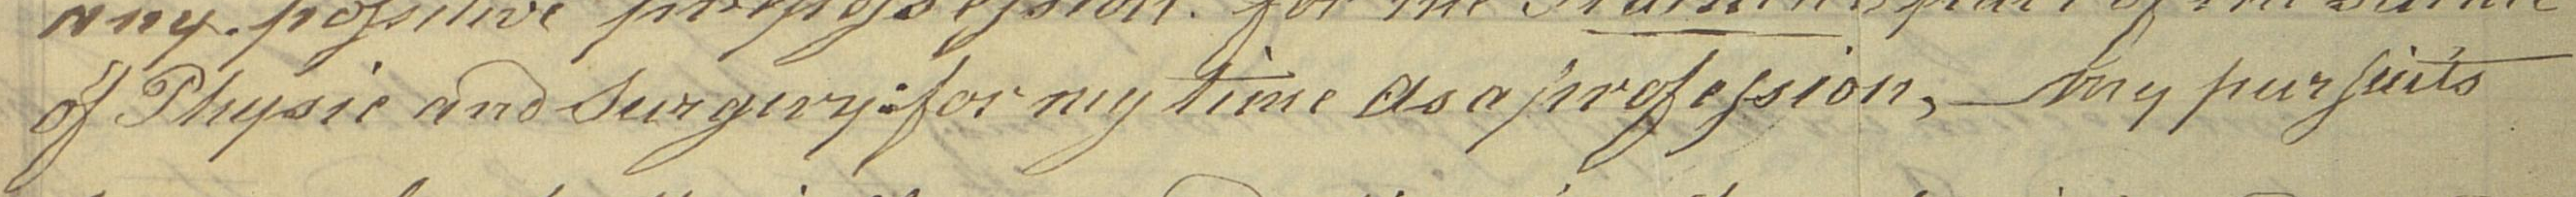of Physic and Surgery: for my time as a profession, my pursuits
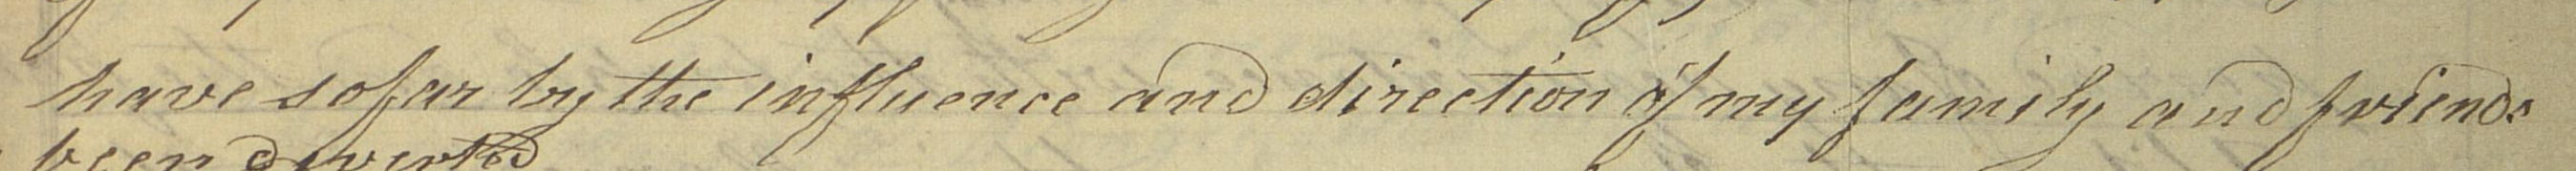have so far by the influence and direction of my family and friends
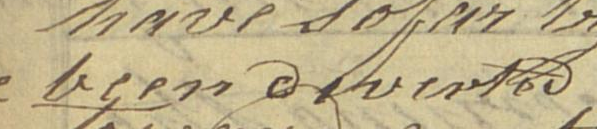been diverted
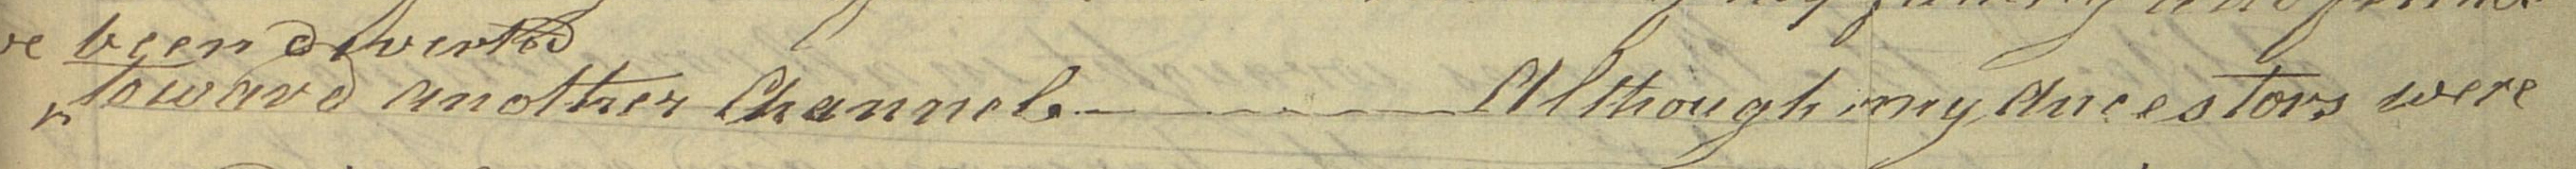toward mother Channel. Although my Ancestors were
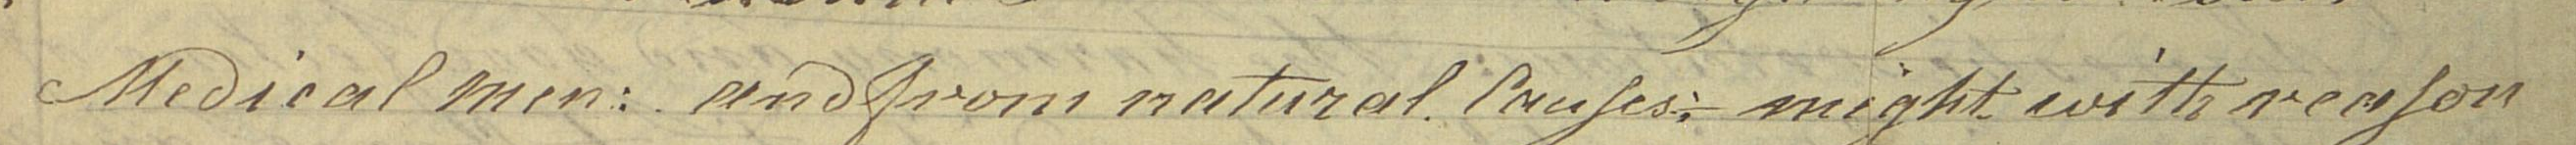Medical men: and from natural Causes; might with reason
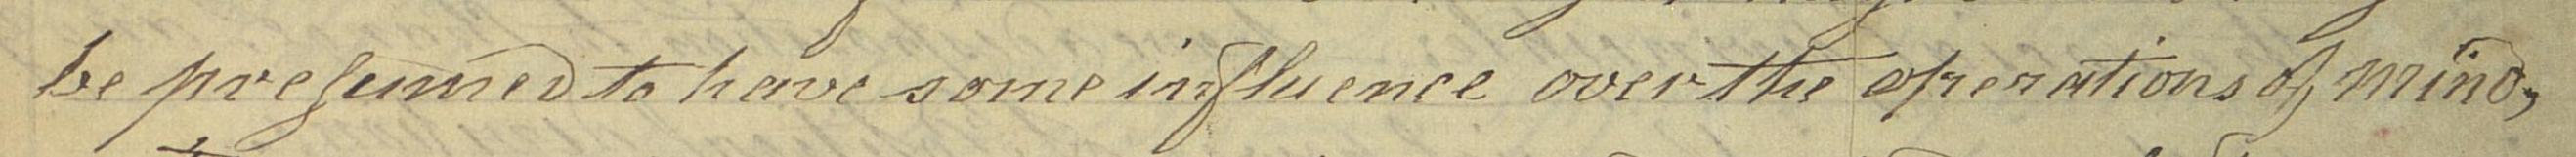be presumed to have some influence over the operations of mind,
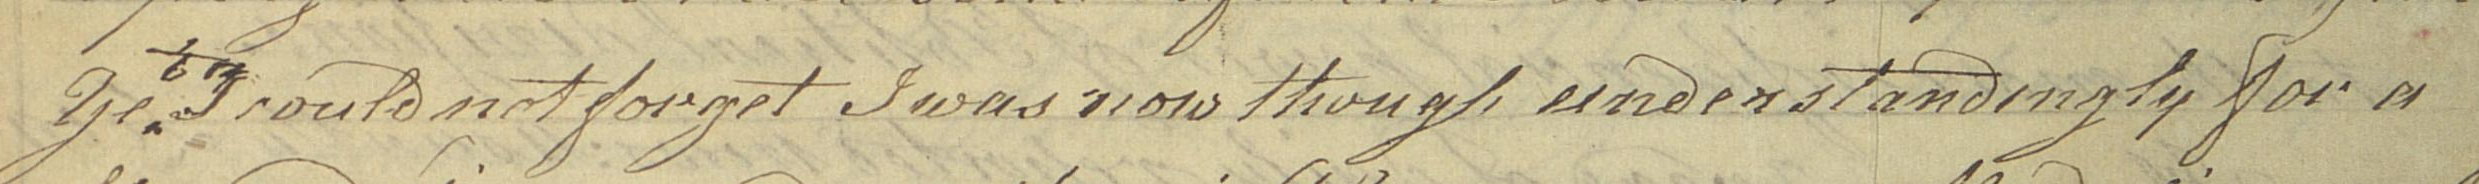Yet I could not forget I was now though understandingly for a
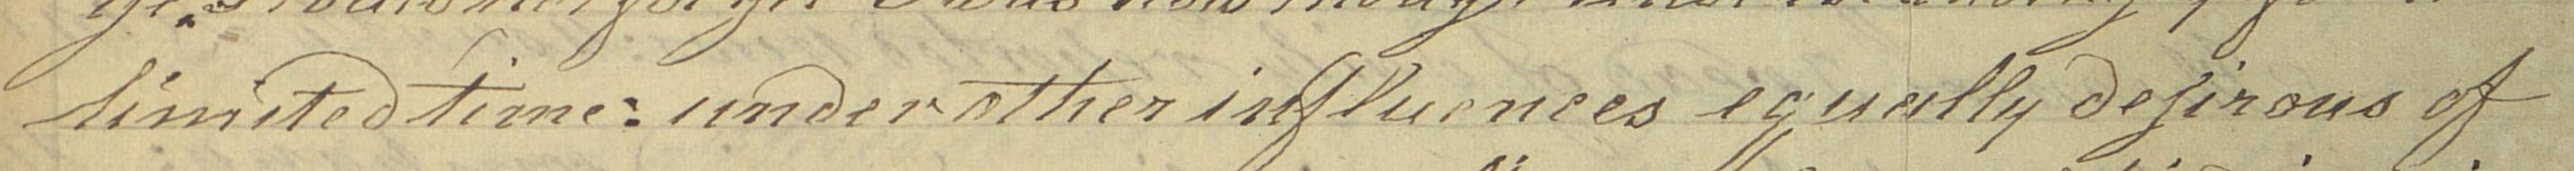limited time: under other influences equally desirous of
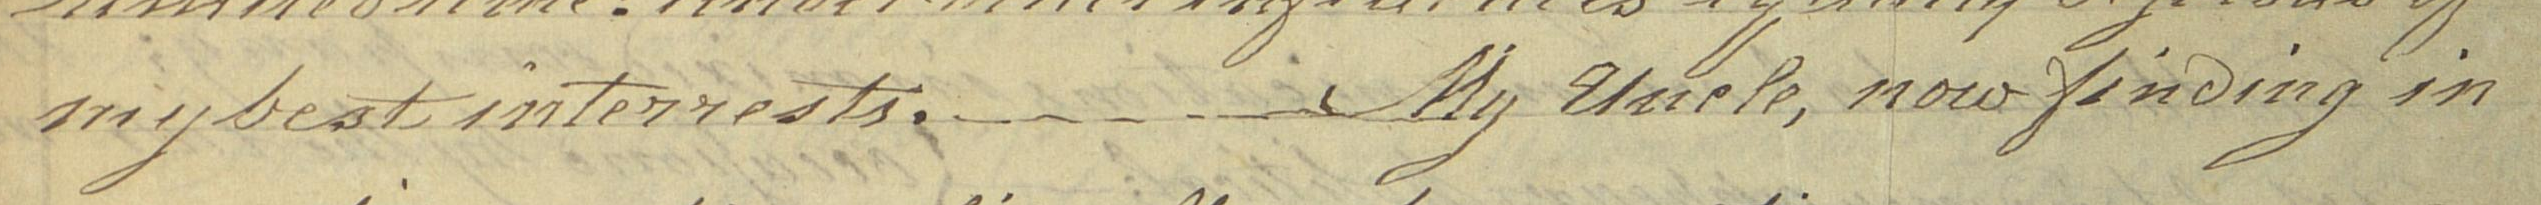my best interrests. My Uncle, now finding in
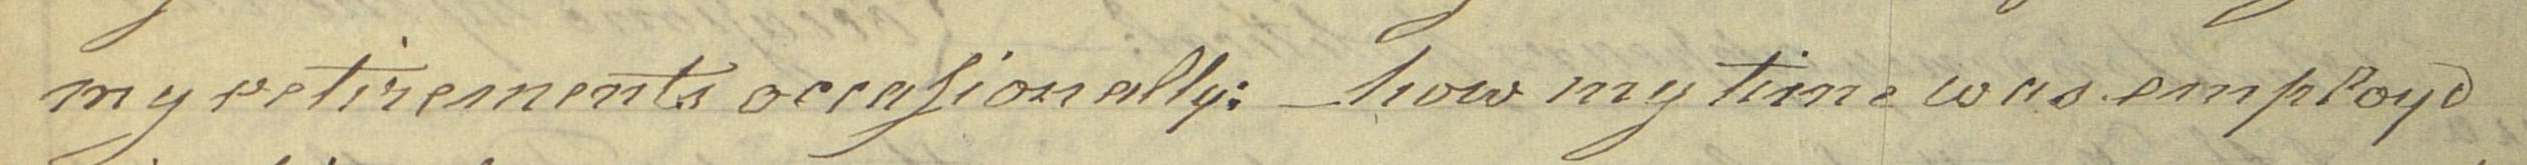my retirements occasionally: how my time was employd
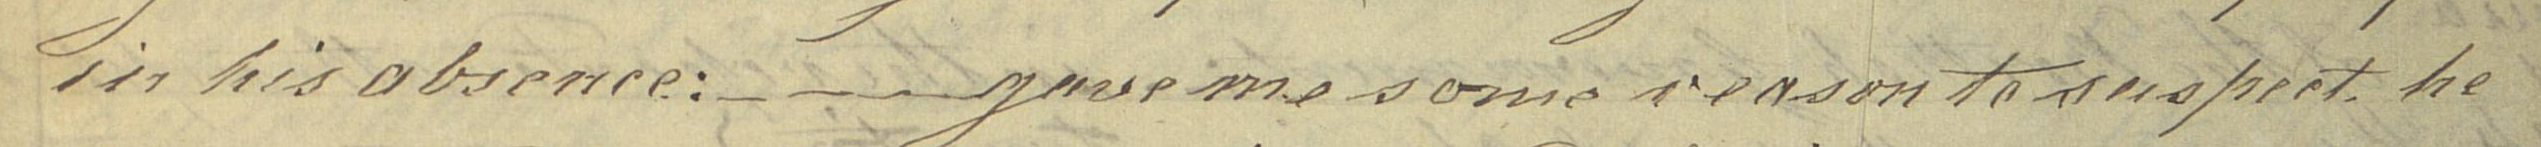in his absence: give me some reason to suspect. he
